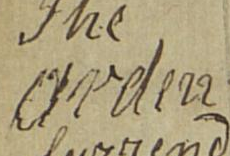Orders
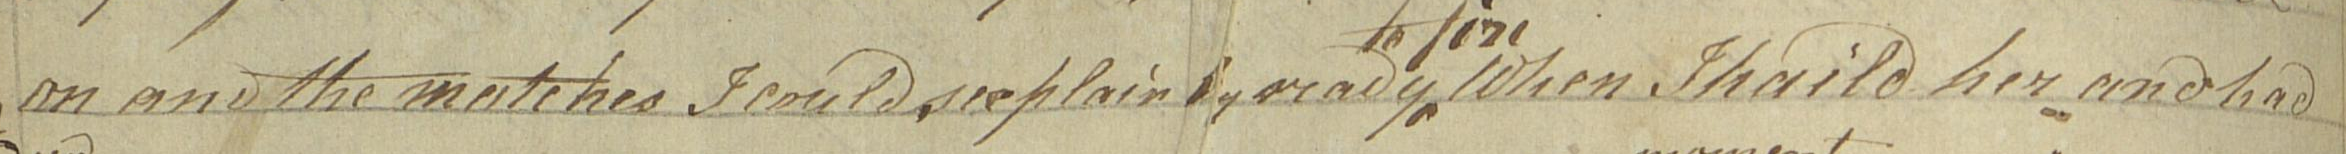on and the matches I could so plainly ready ^ when I haild her and had
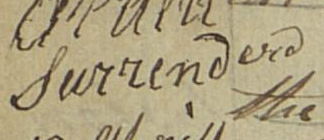Surrendered
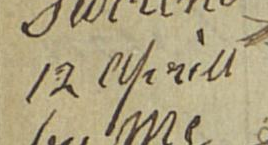12 Aprill
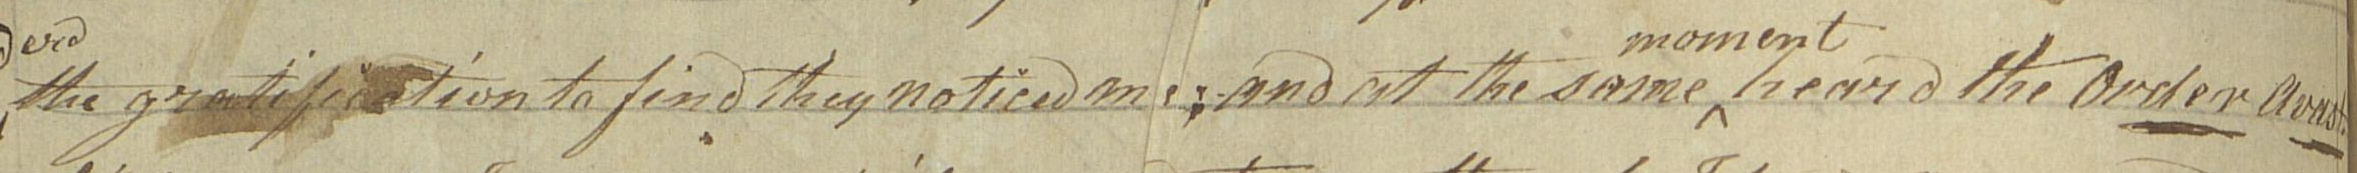the gratification to find they noticed me; and at the same, ^ heard the Order Avas-
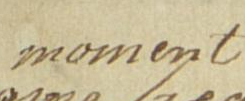moment
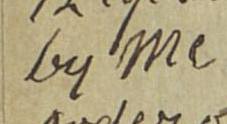by Me
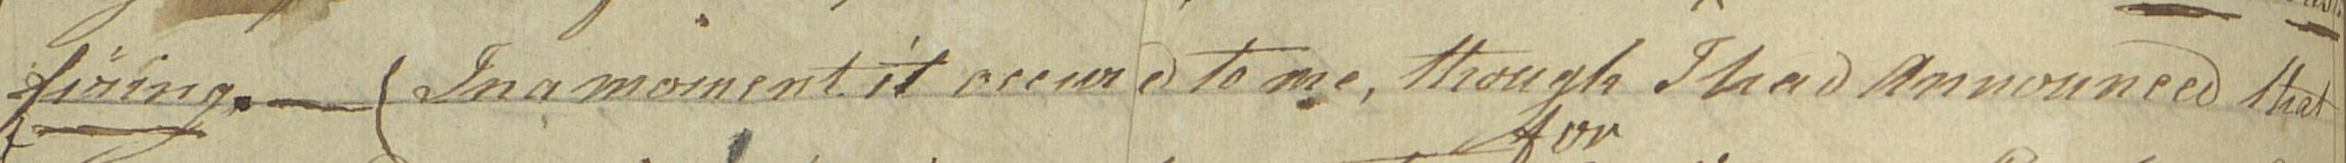firing. (In a moment it occurd to me, though I had announced that
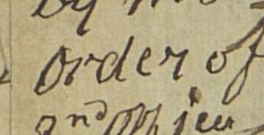order of
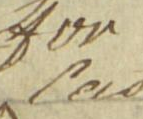for
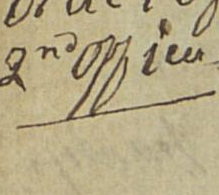2^nd Officer
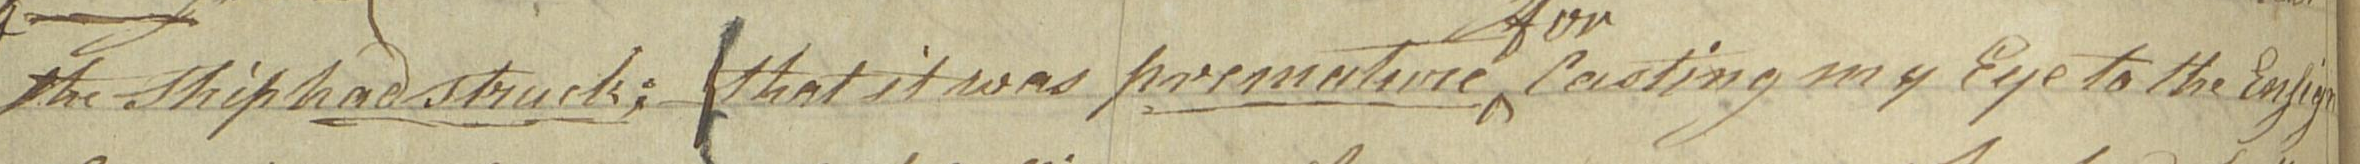the Ship had struck; (that it was premature ^ Casting my Eye to the Ensign
